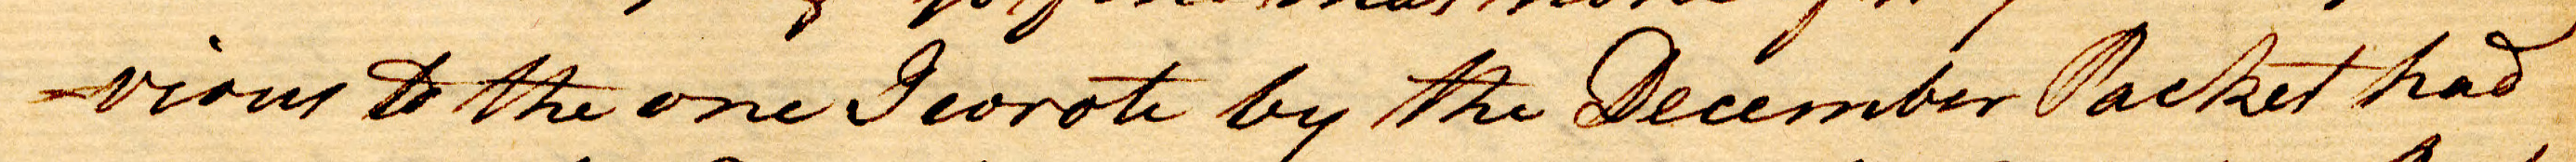-vious to the one I wrote by the December Packet had
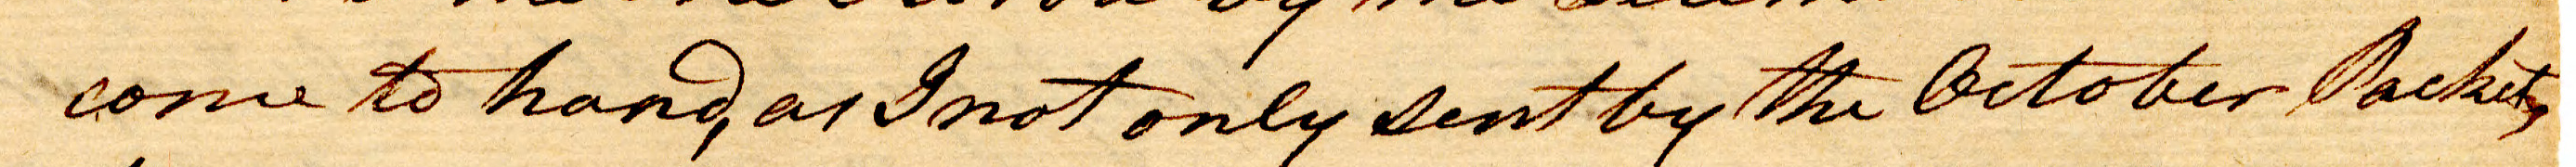come to hand, as I not only sent by the October Packet,
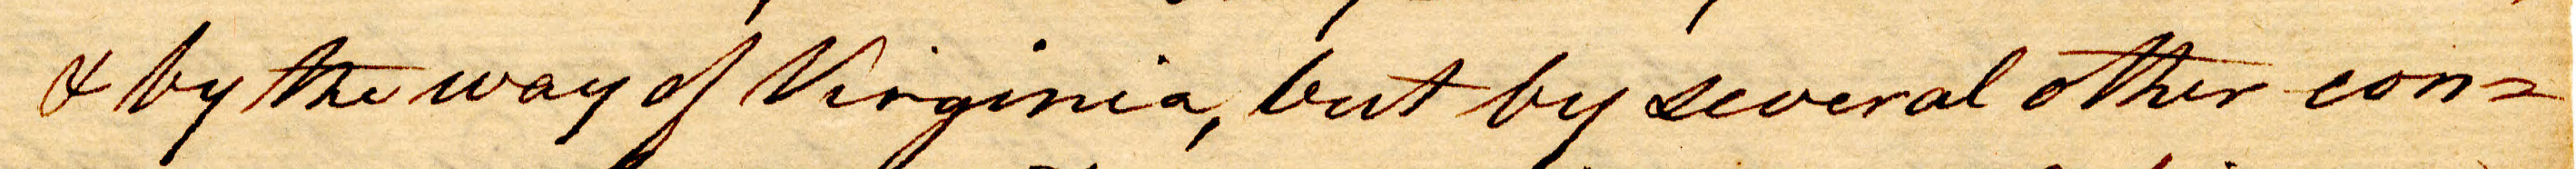& by way of Virginia, but by several other con-
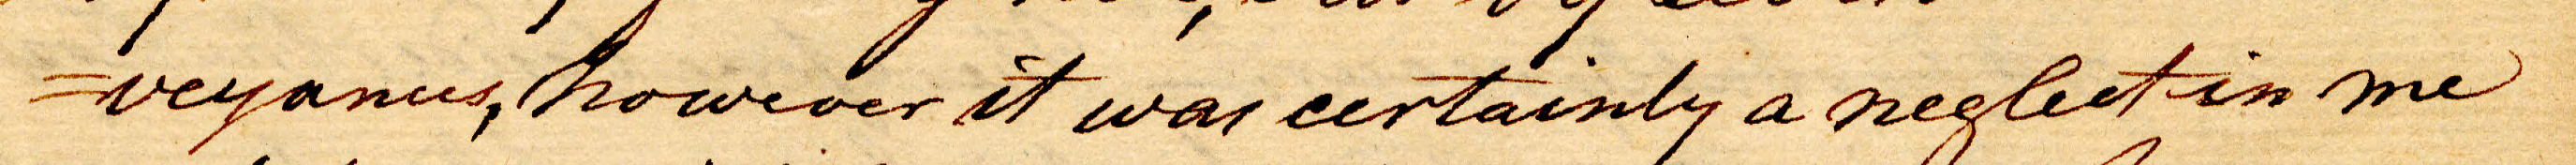veyances, however it was certainly a neglect in me
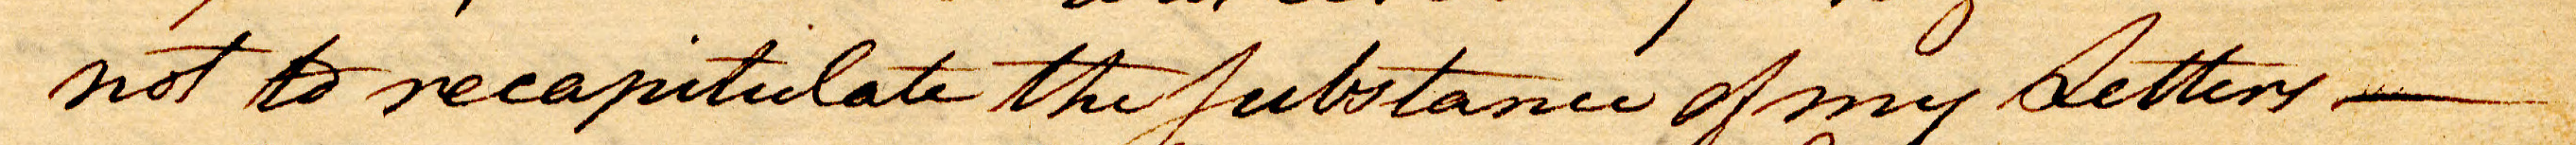not to recapitulate the substance of my Letters-
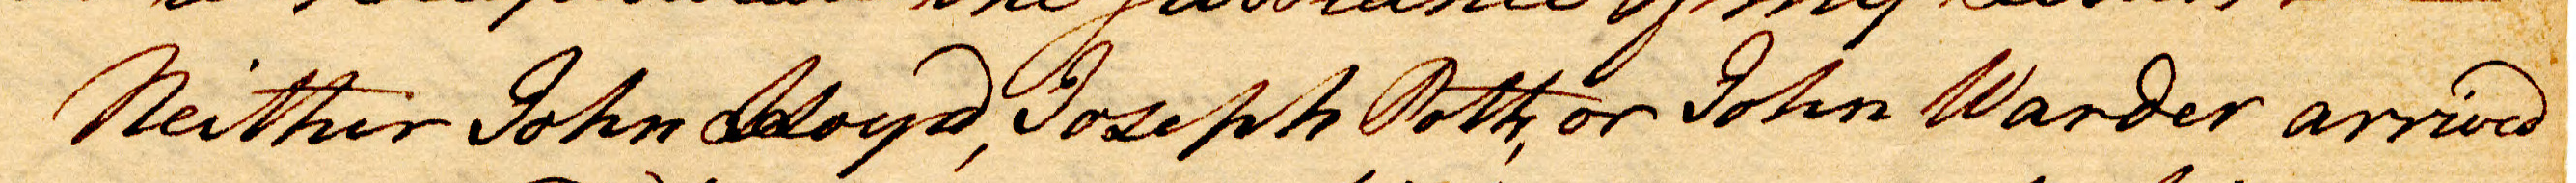Neither John Lloyd, Joseph Potts, or John Warder arrived
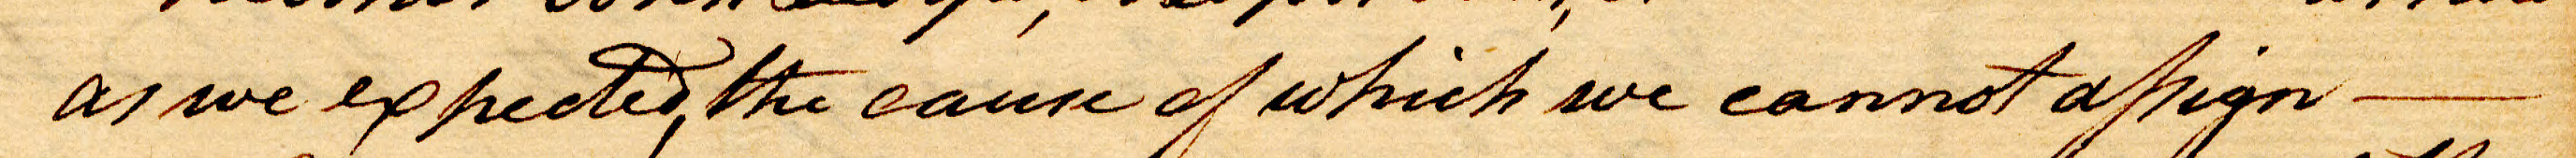as we expected, the cause of which we cannot assign-
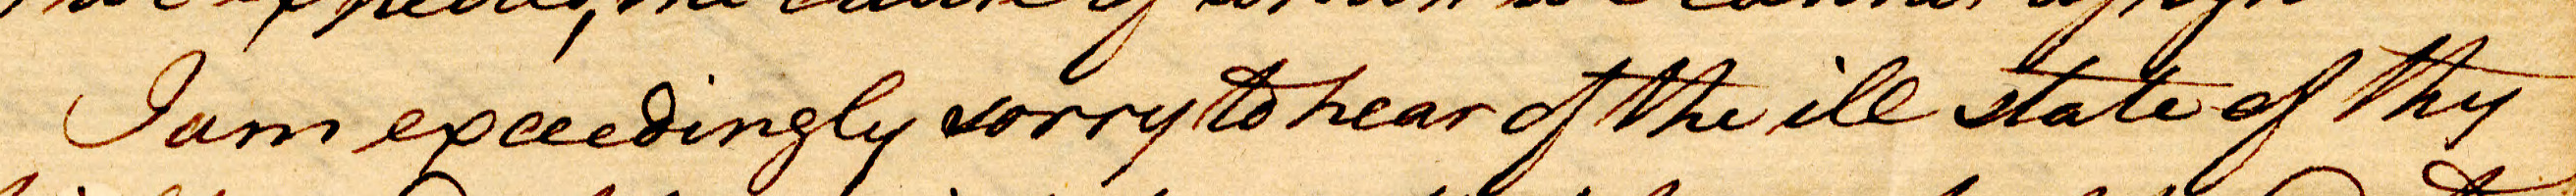I am exceedingly sorry to hear of the ill state of thy
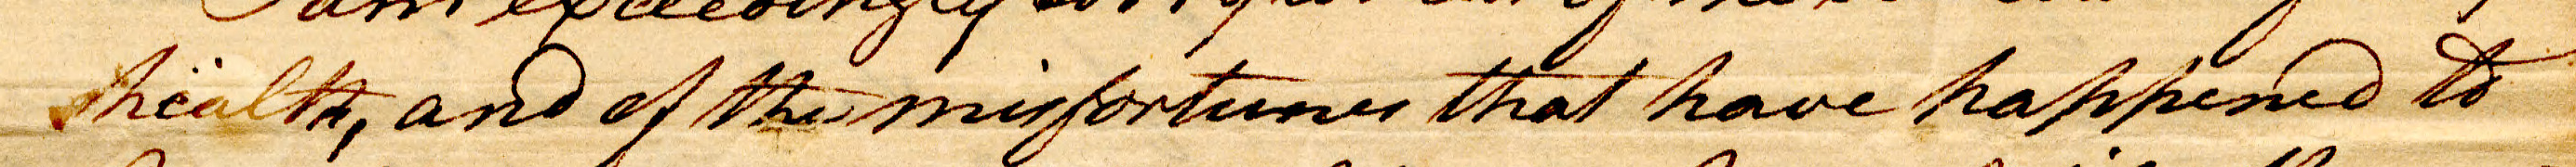health, and of the misfortunes that have happened to
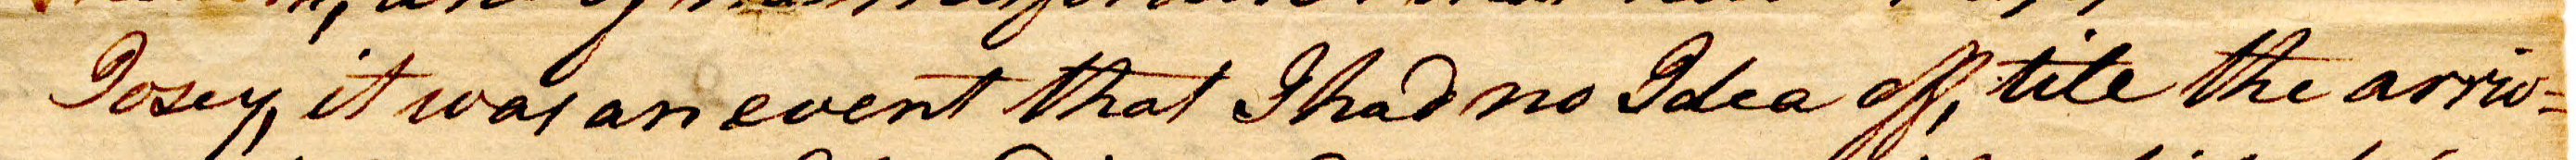Josey, it was an event that I had no Idea off, till the arriv-
